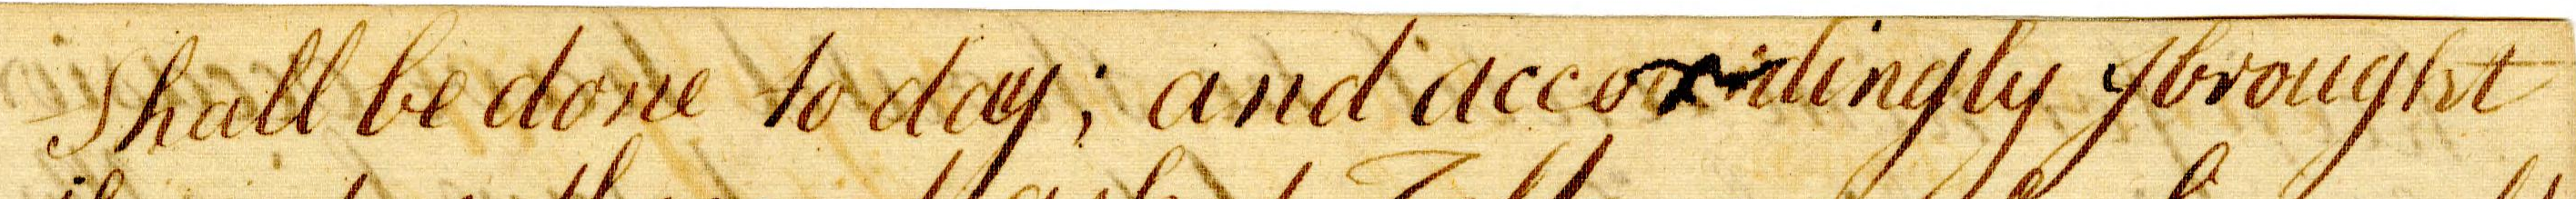shall be done to day; and accordingly I brought
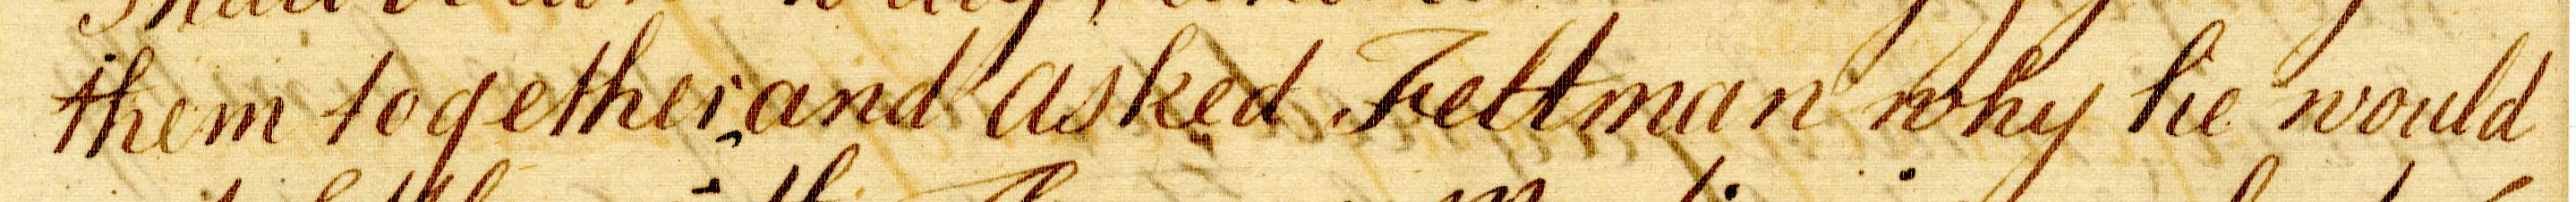them together ^ and asked Feltman why he would
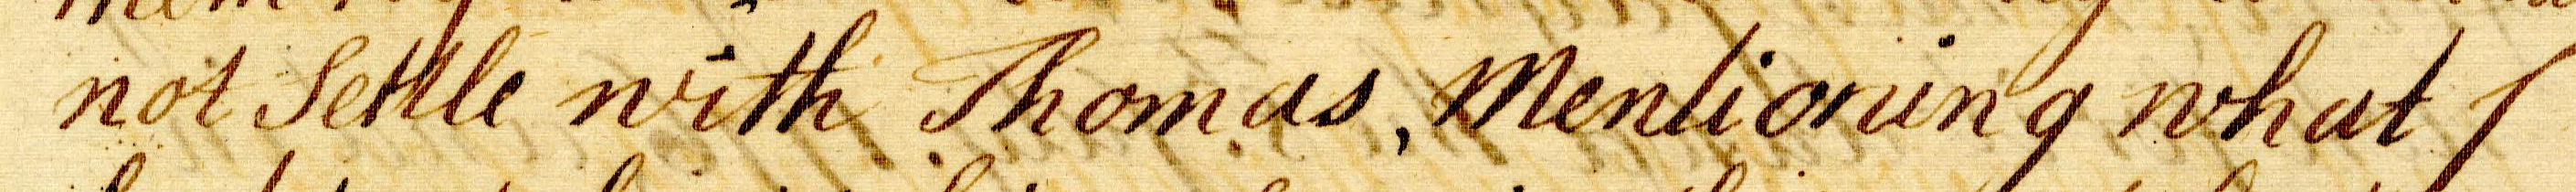not Settle with Thomas, Mentioning what I
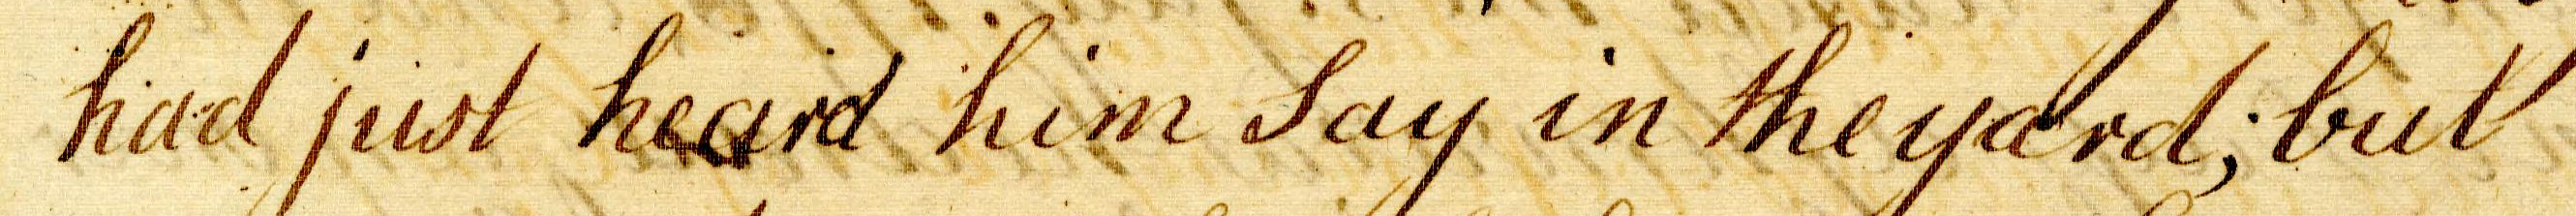had just heard him say in the yard; but
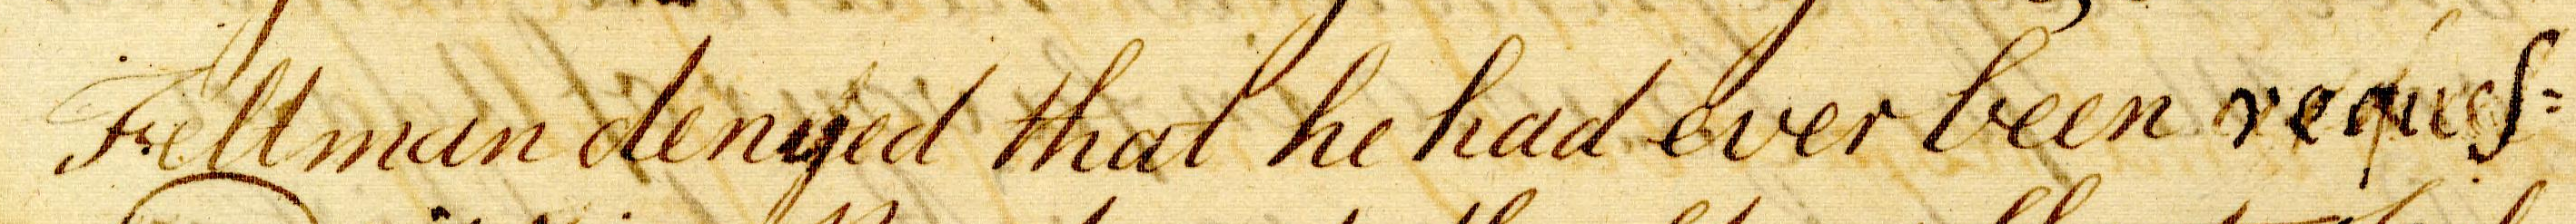Feltman denyed that he had ever been reques-
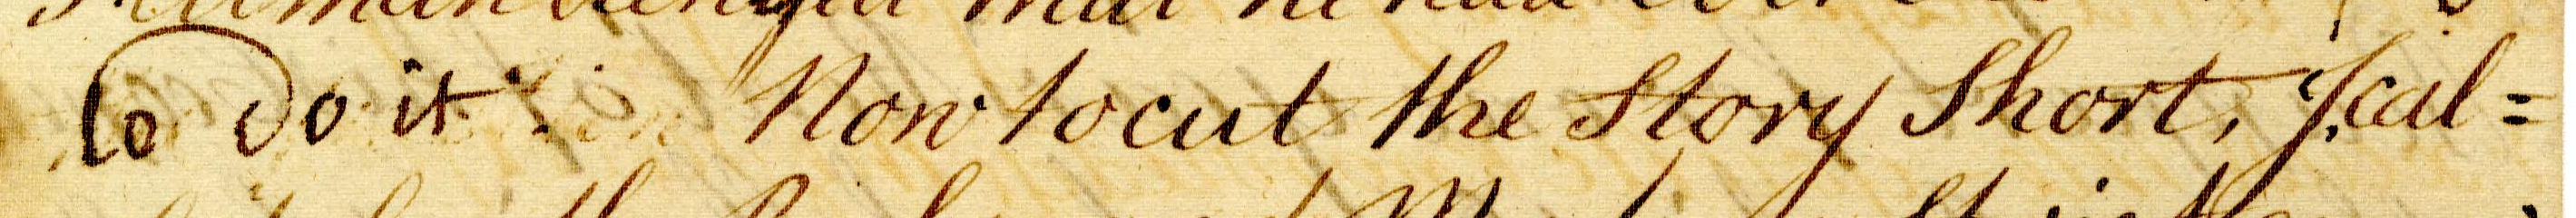to do it Now to cut the story Short, I cal-
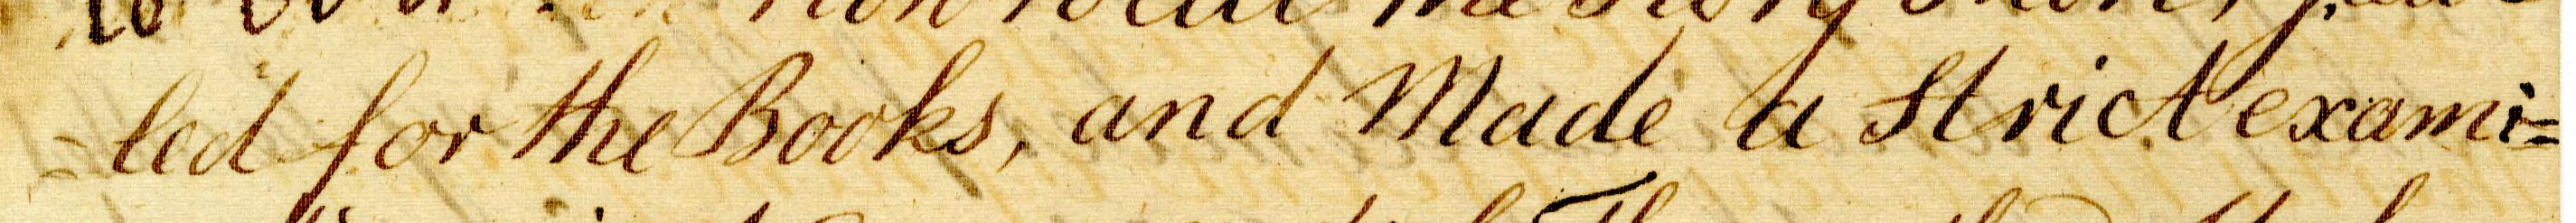-led for the Books, and Made a strict examin-
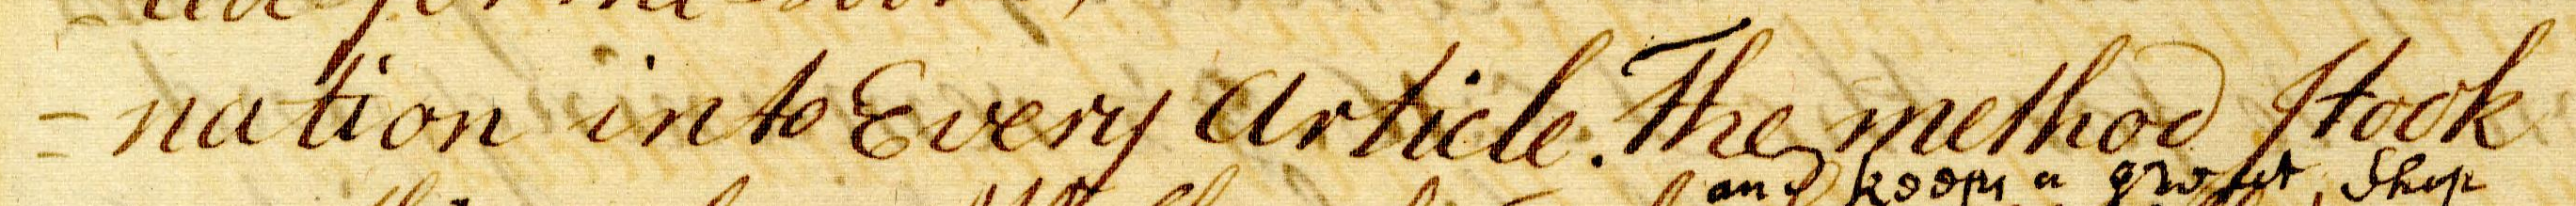-nation into Every Article. The method I took
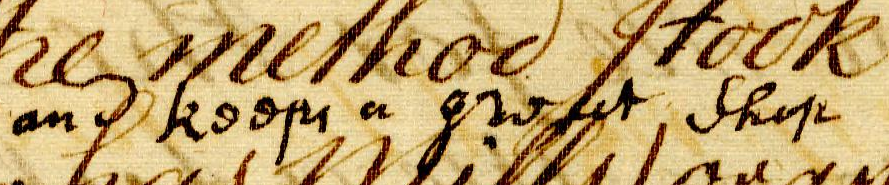and keeps a {great} Shop
